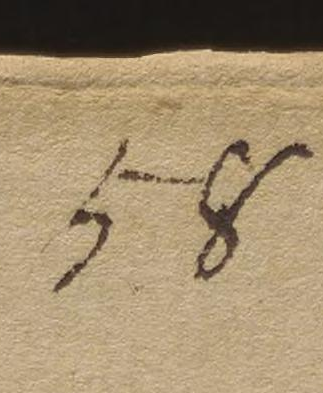58
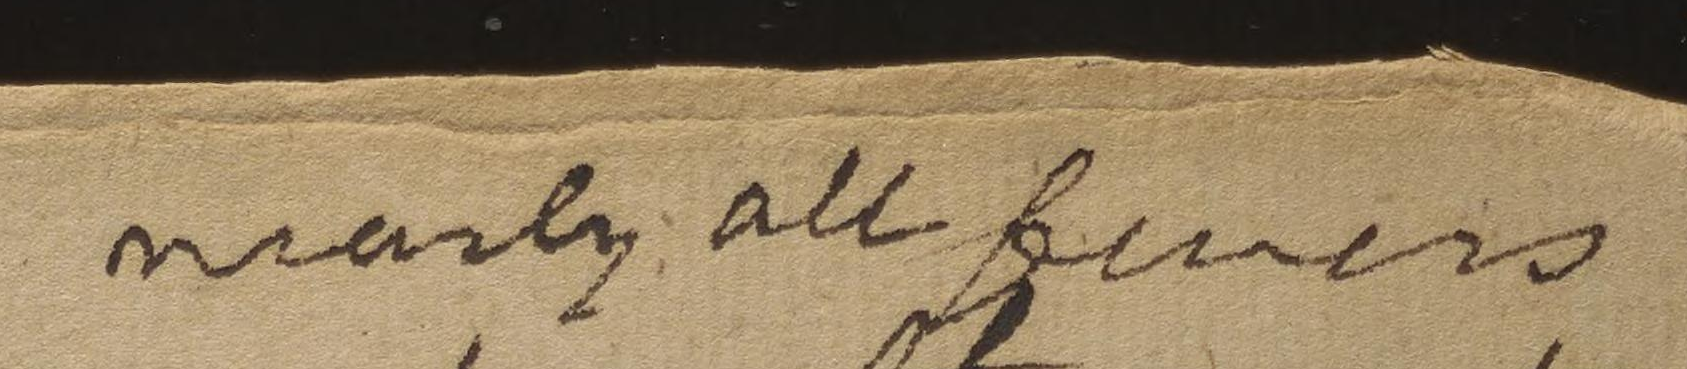nearly all fevers
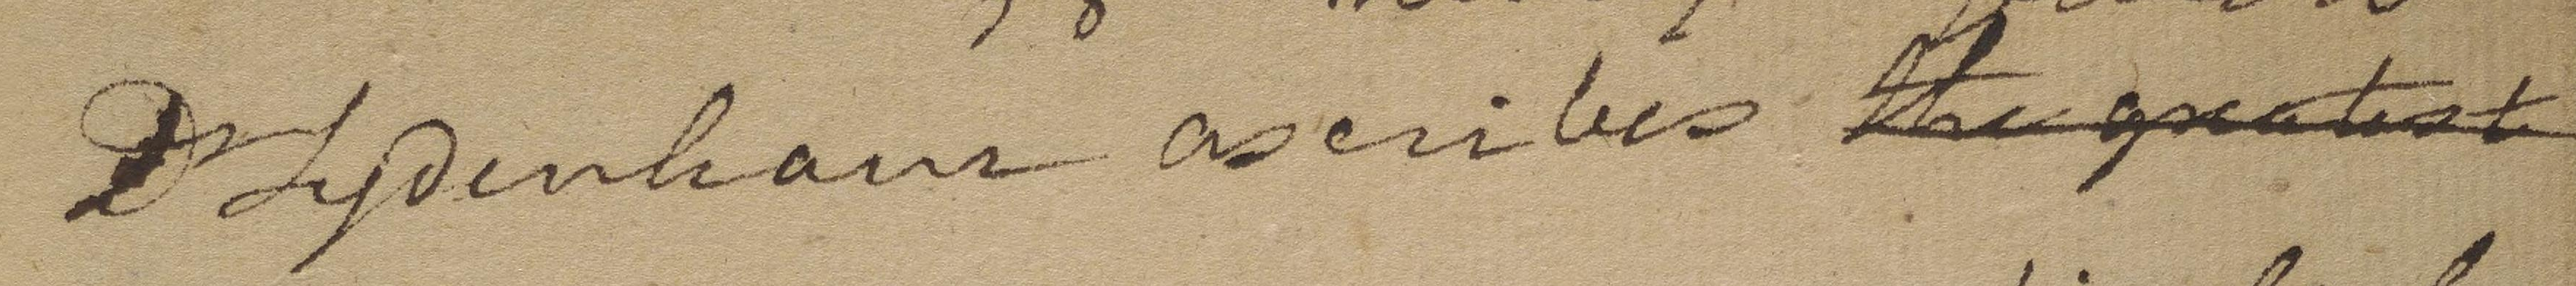D^r Sydenham ascribes [the greatest]
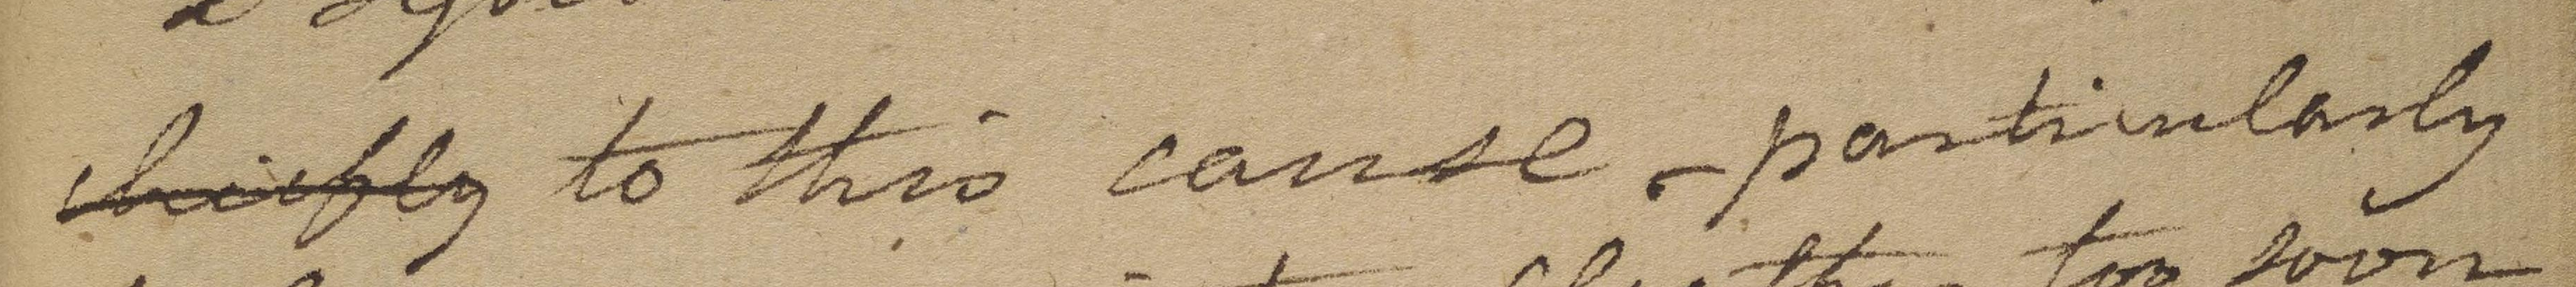[chiefly] to this cause- particulary
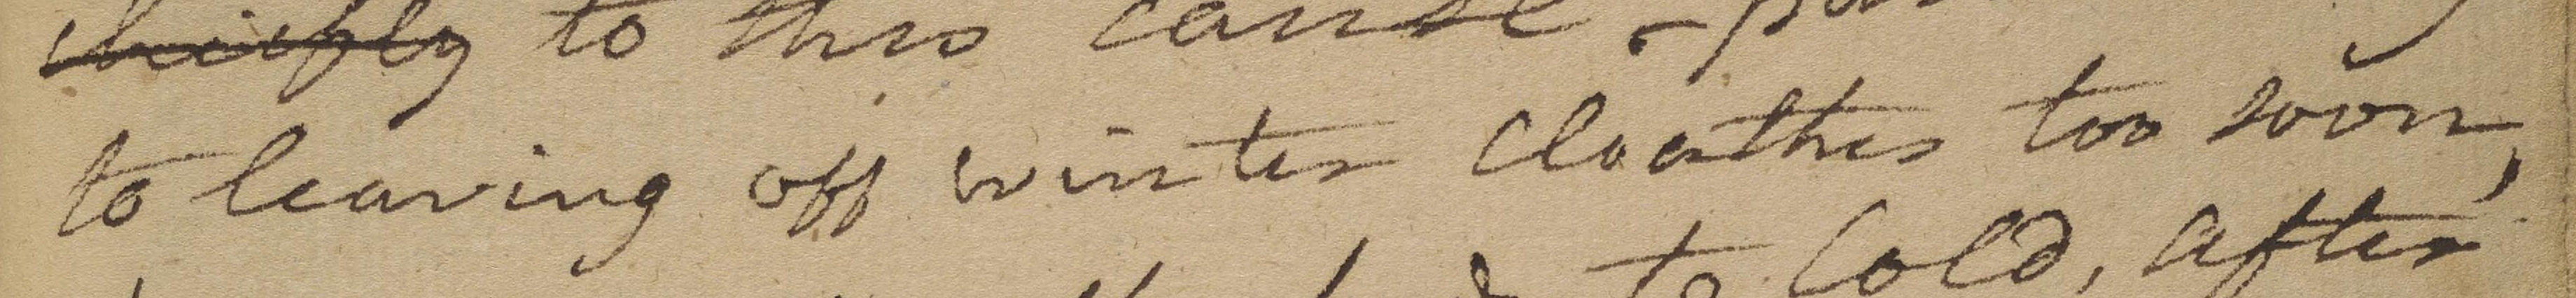to leaving off winter cloathes too soon,
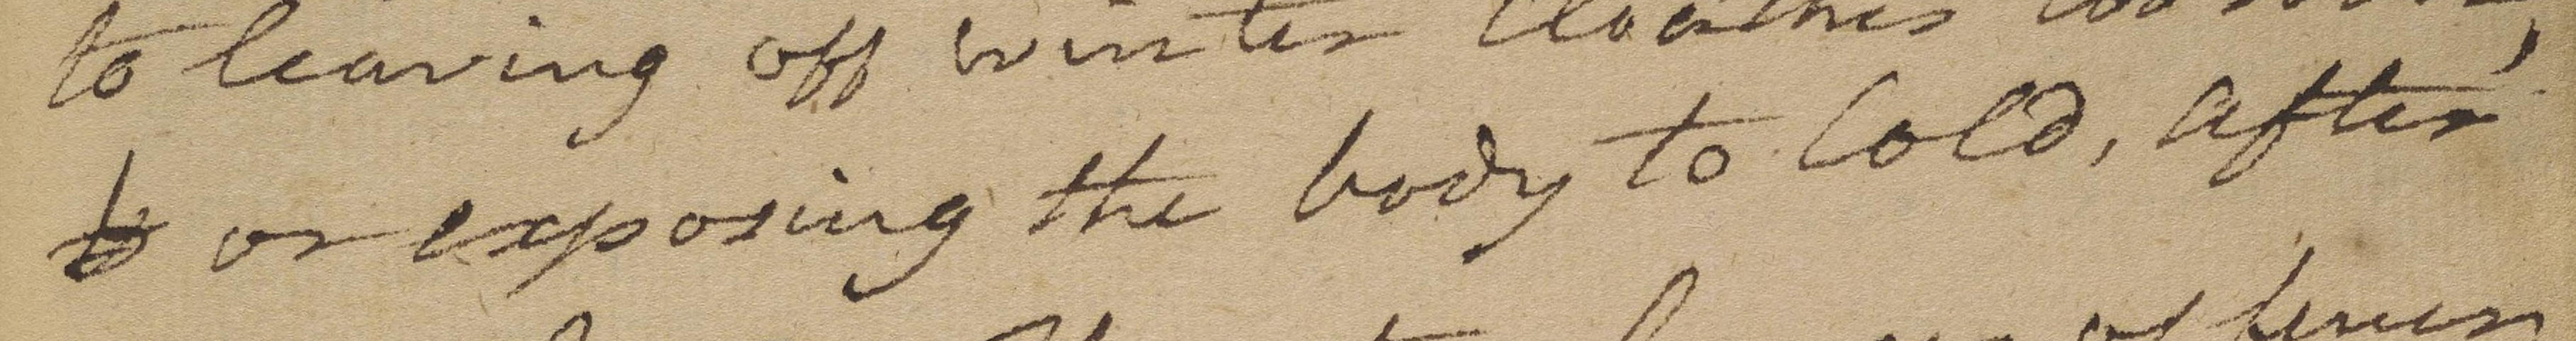[to] or exposing the body to cold, after
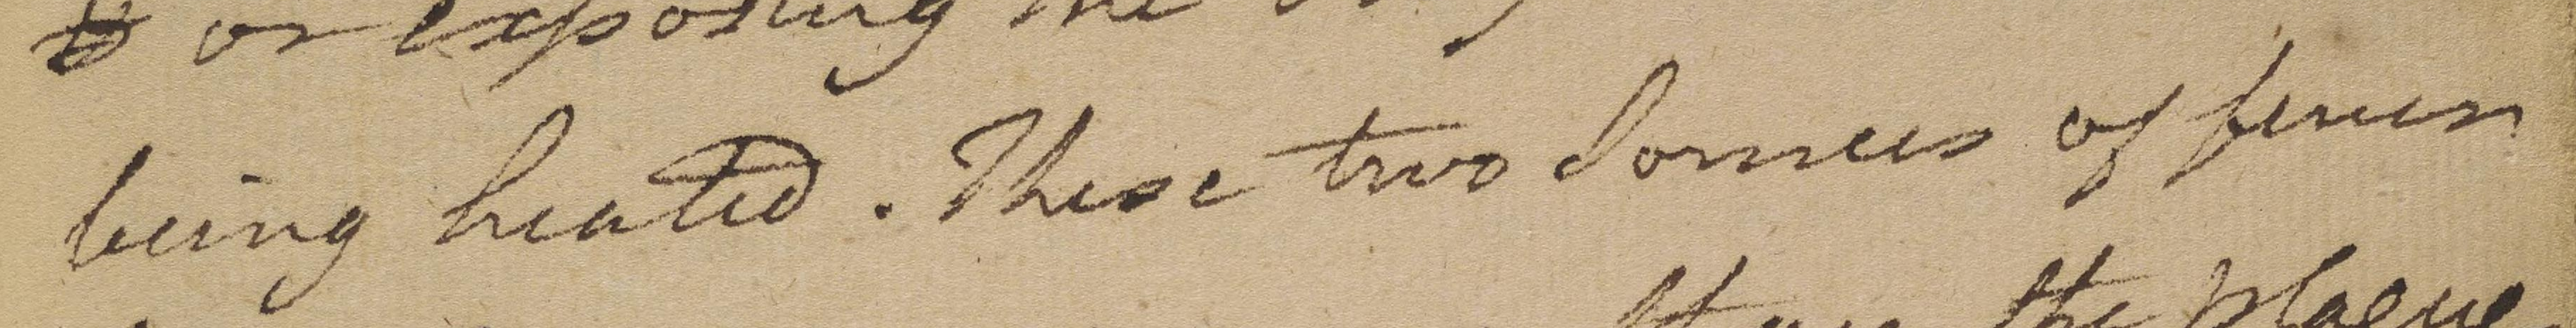being heated. These two sources of fever
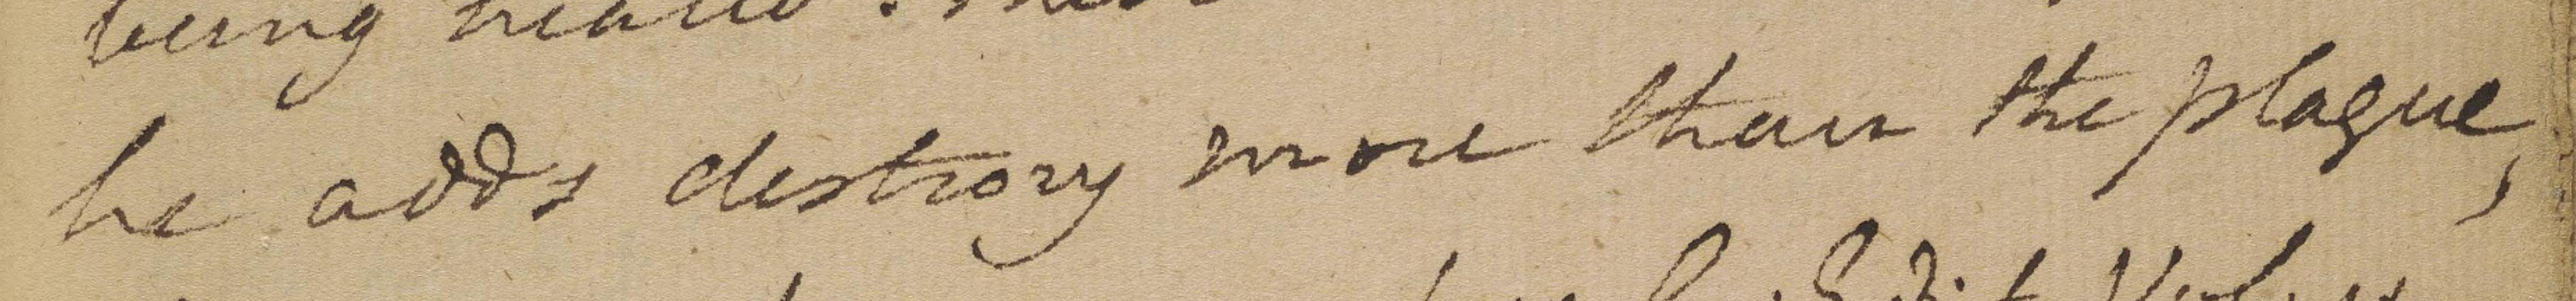he adds destroy more than the plague,
